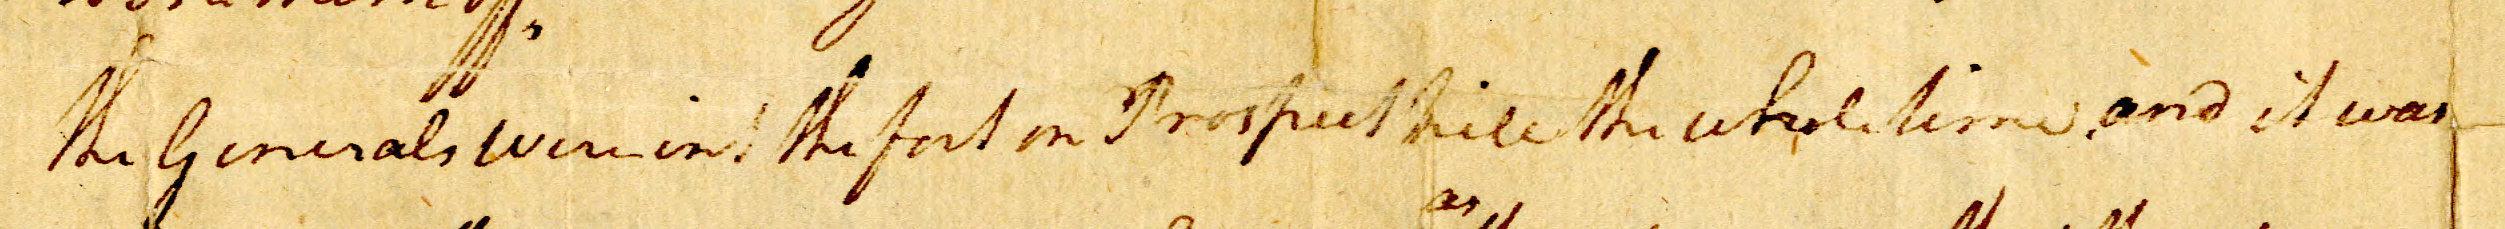the Generals were in the fort on Prospect hill the whole time, and it was
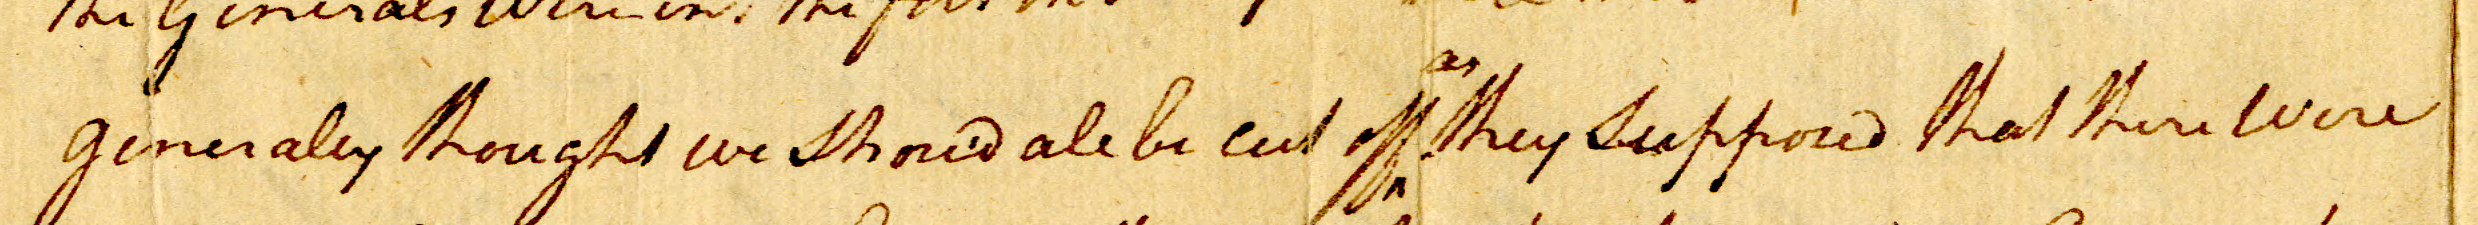generally thought we shou'd all be be cut off ^as they supposed that there were
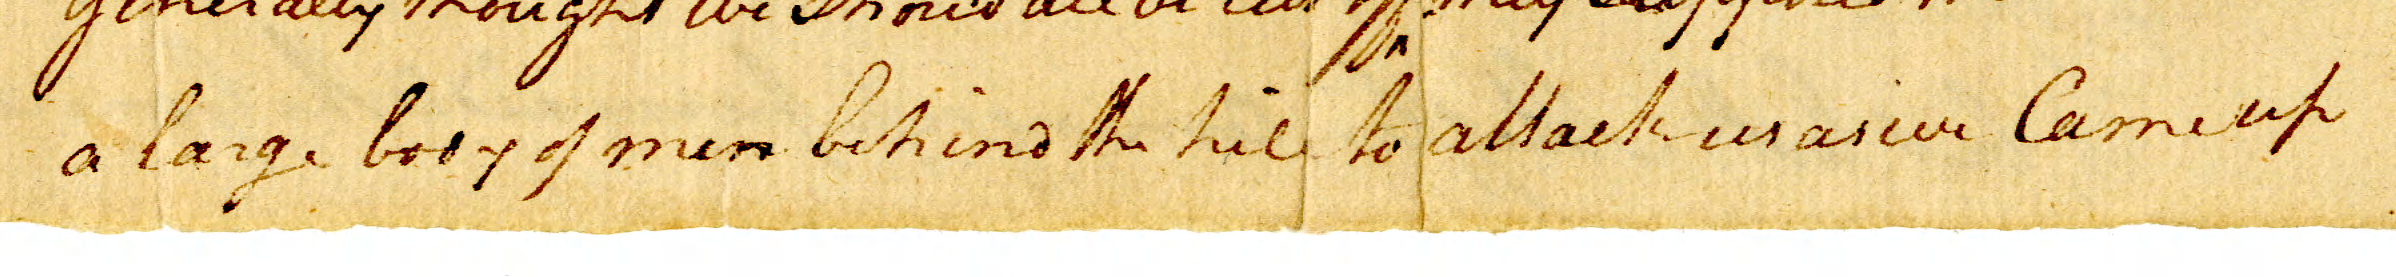a large body of men behind the hill to attack us as we Came up
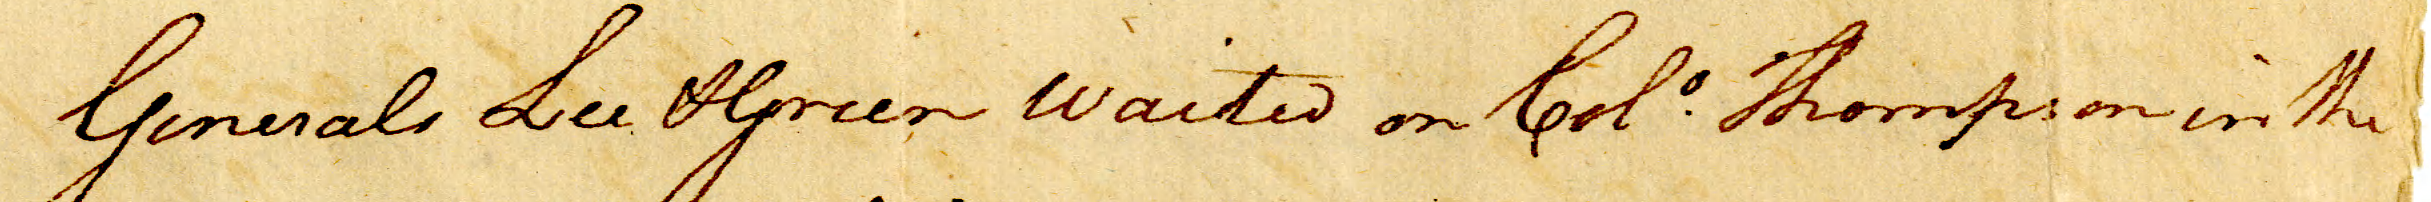Generals Lee & Green waited on Col^o. Thompson in the
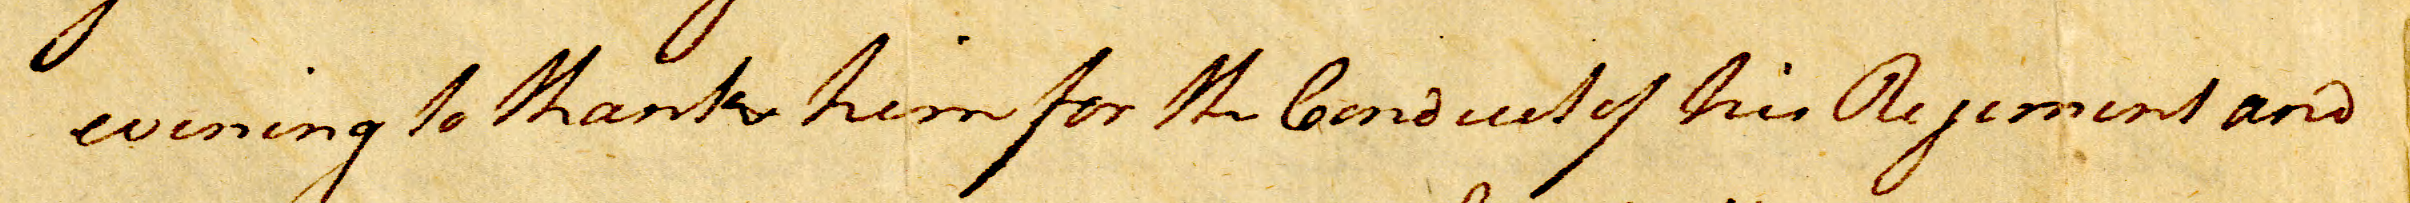evening to thank him for the conduct of his Regiment and
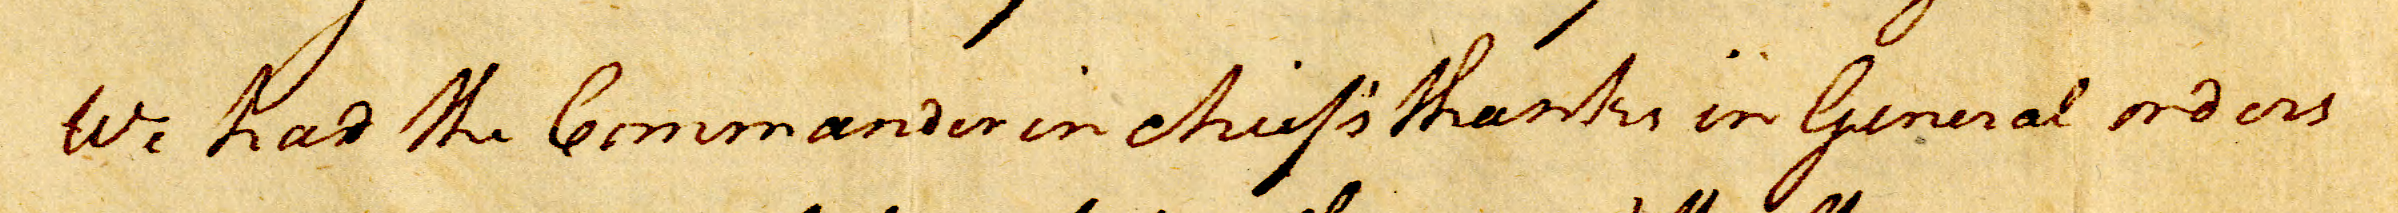we had the Commander in chief's thanks in General orders
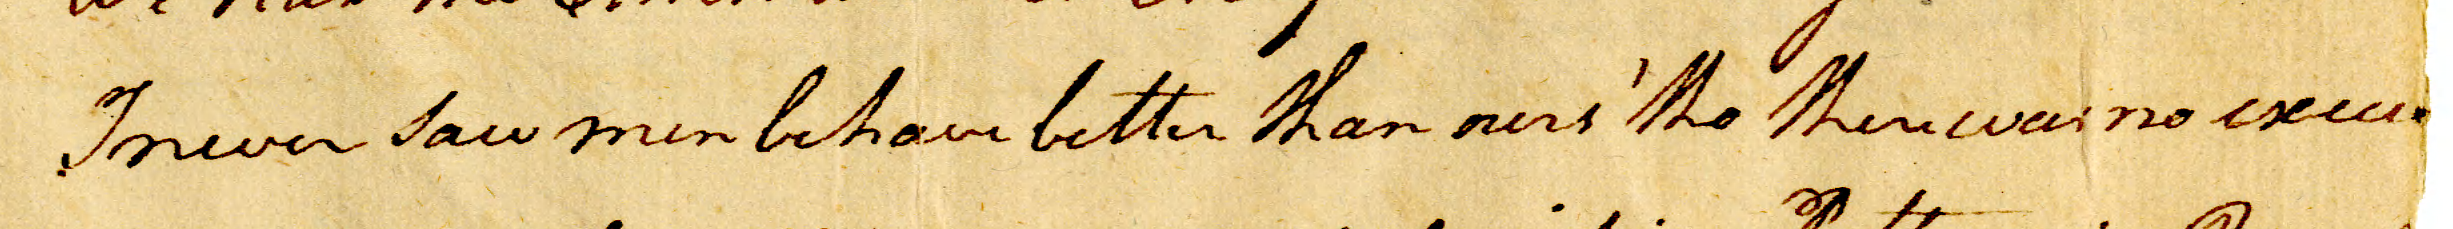I never saw men behave better than ours 'tho there was no execu
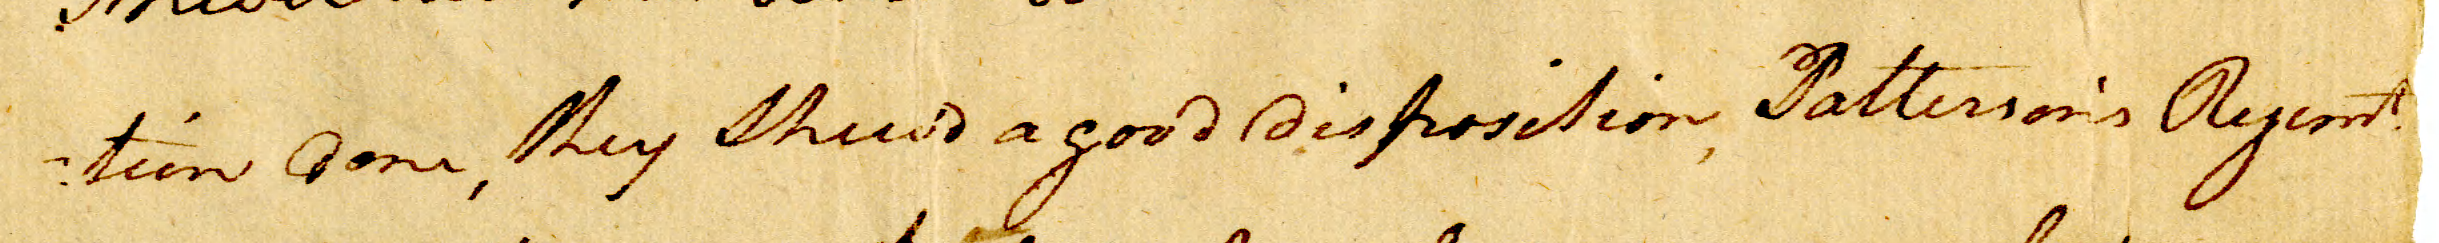-tion done, they shew'd a good disposition. Patterson's Regem^t.
